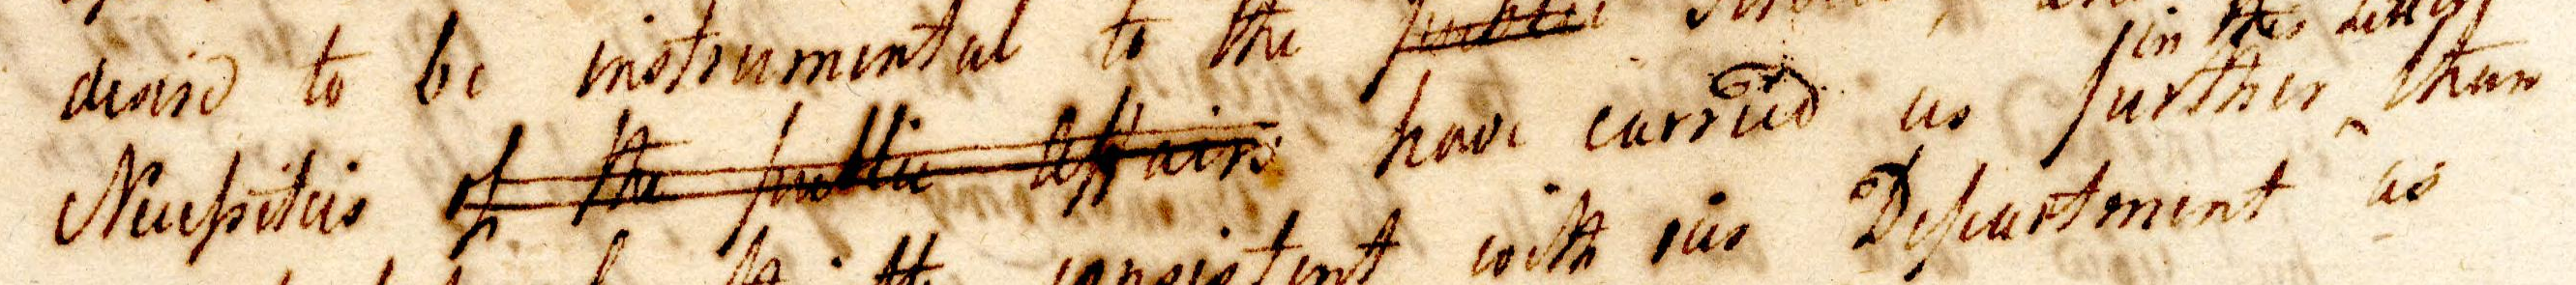Necessities of the public Affairs have carried us further ^ than
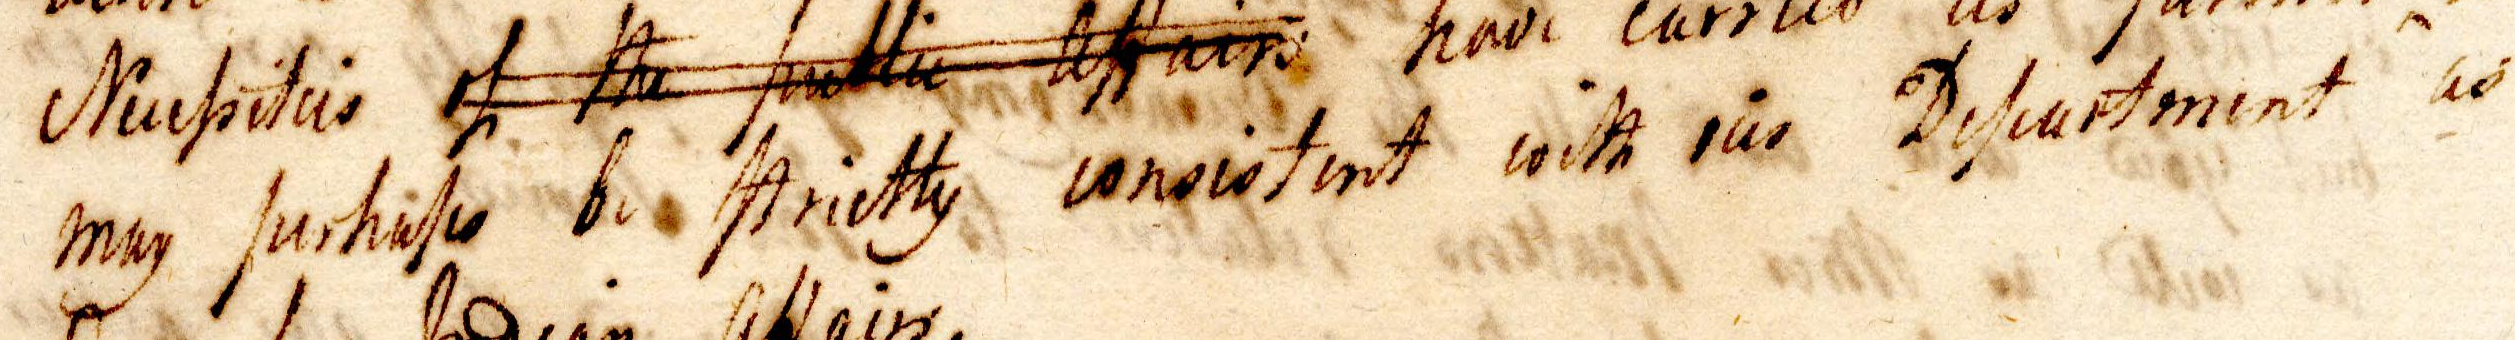may perhaps be strictly consistent with our Department as
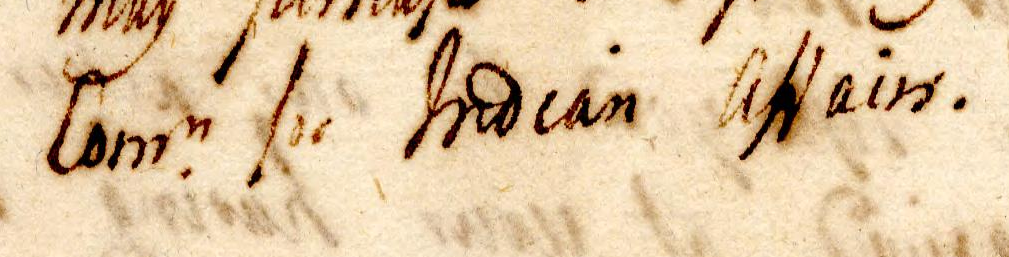Com^r. for Indian Affairs.
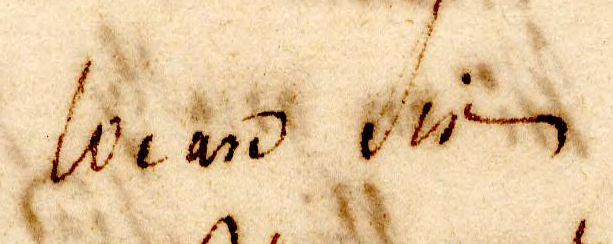We are Sir
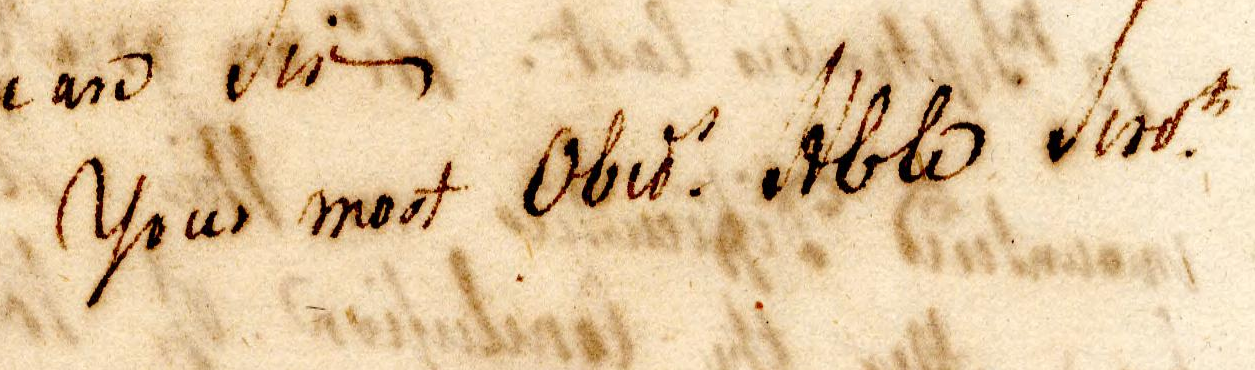Your most Obed^t. Hble Serv^t.
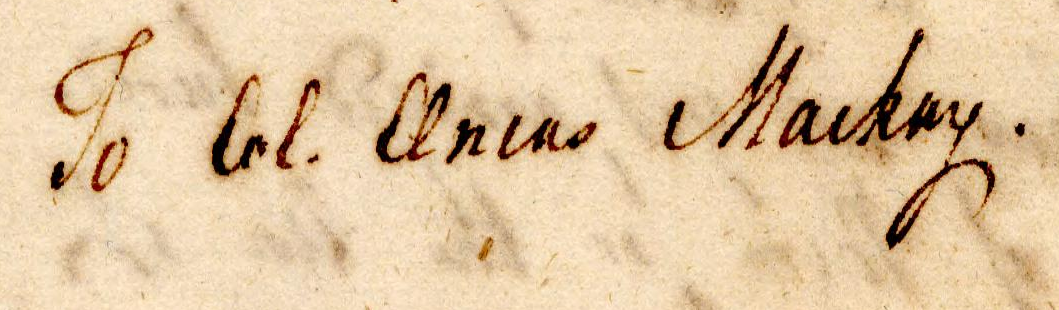To Col. Aeneas Mackay.
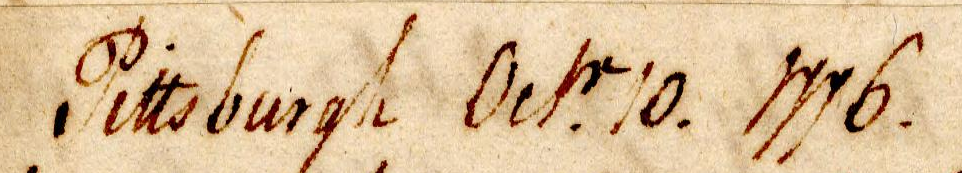Pittsburgh Oct^r. 10. 1776.
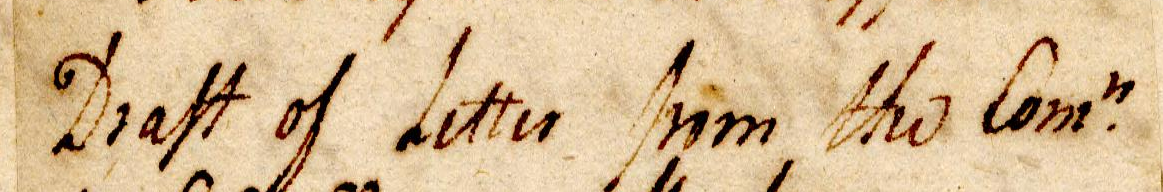Draft of Letter from the Com^n.
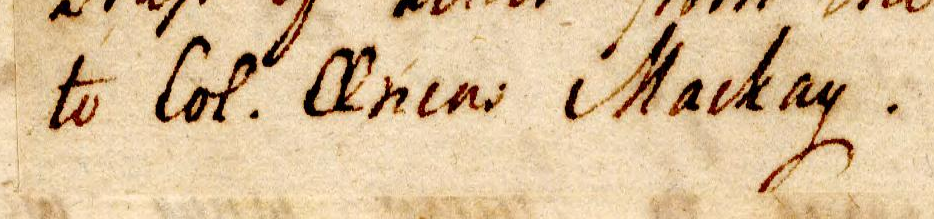to Col. Aeneas Mackay.
